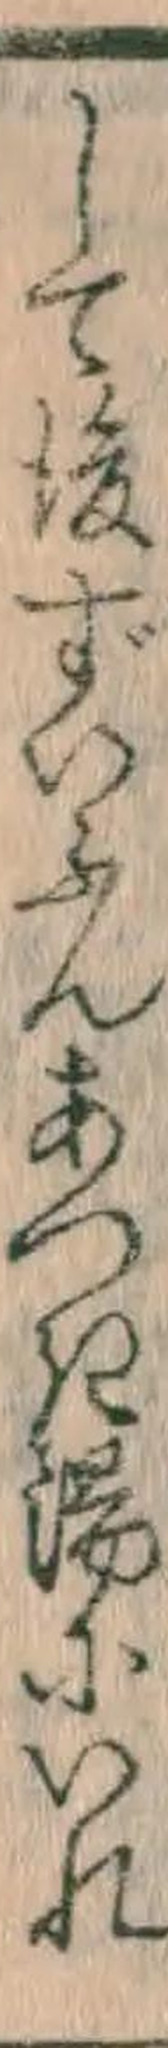して後ずいふんあつき湯にいれ
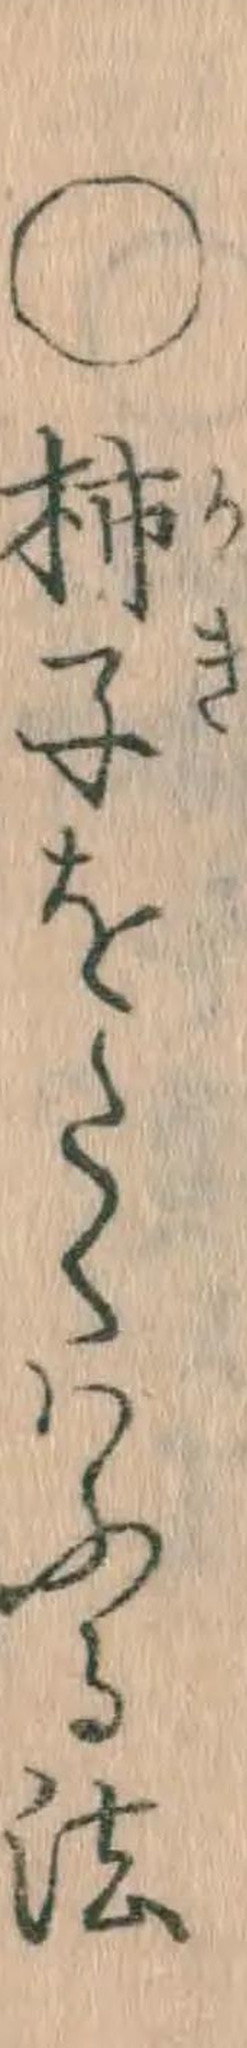○柿子をたくはふる法
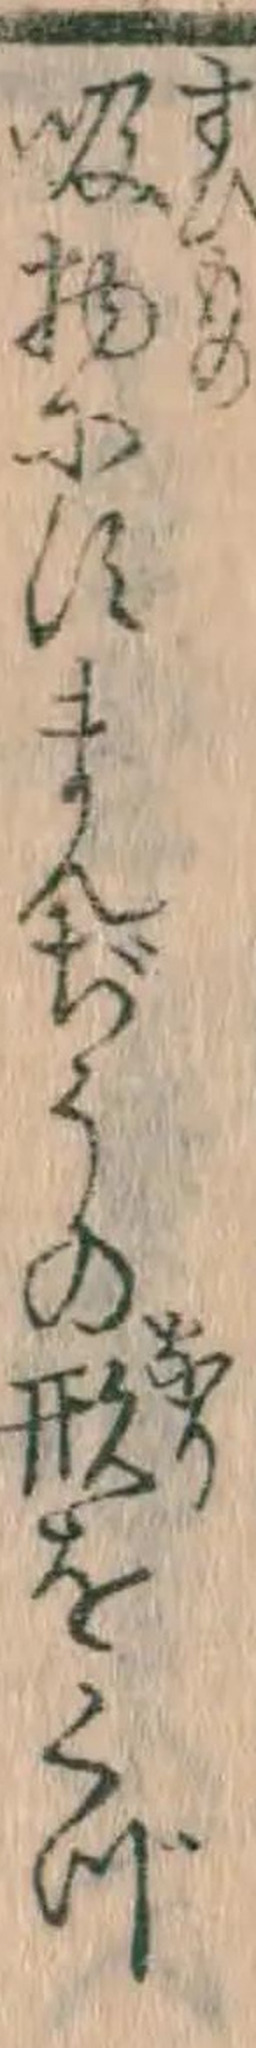吸物にすまんぢうの形をくづ
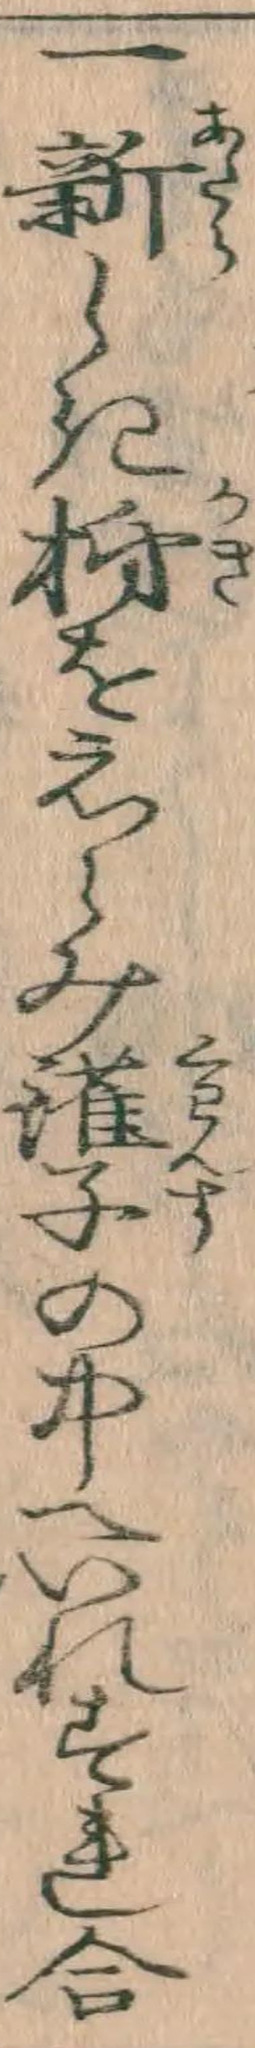一新しき柿をえらみ鑵子の中へいれすれ合
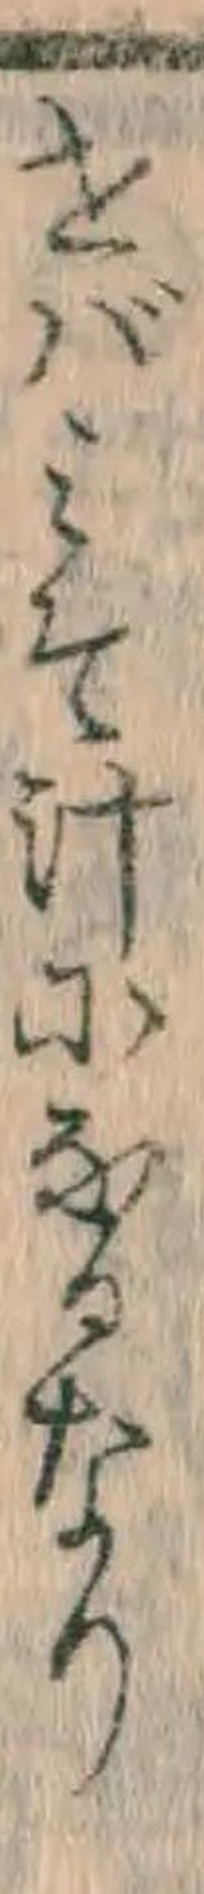せばみそ汁になるなり
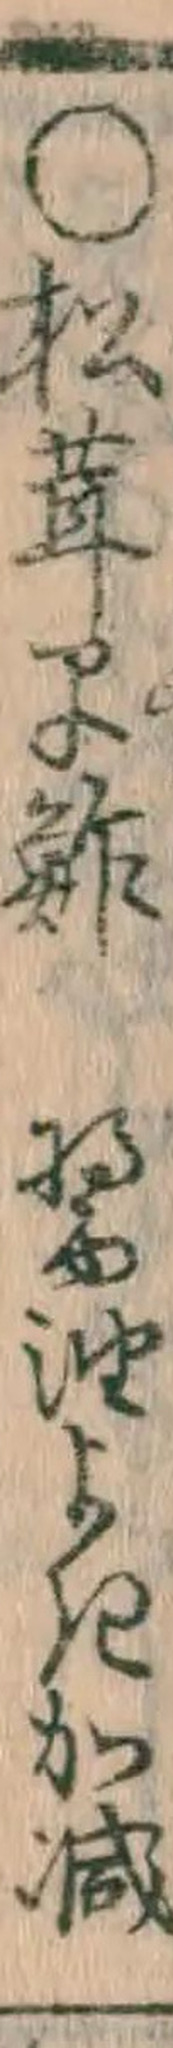○松茸早鮓醬油よき加減
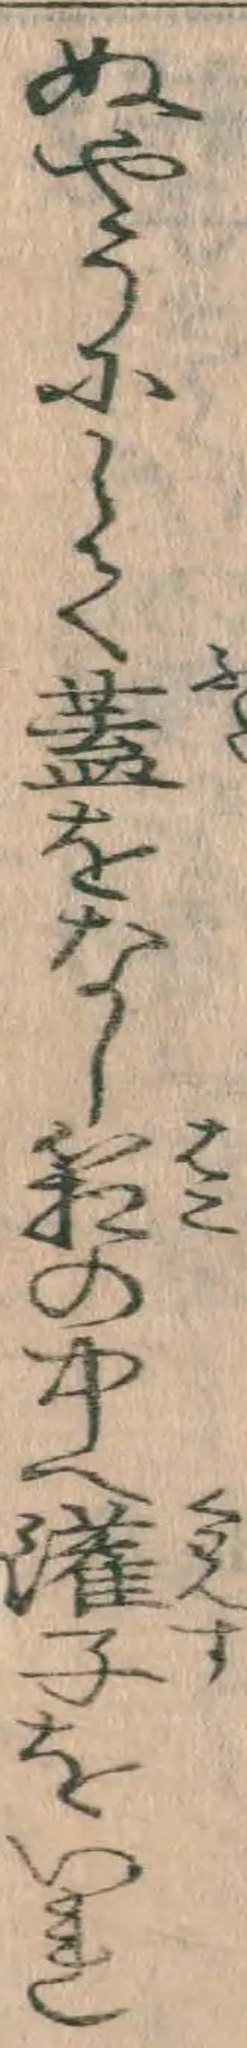ぬやうにして蓋をなし箱の中へ鑵子をいれ
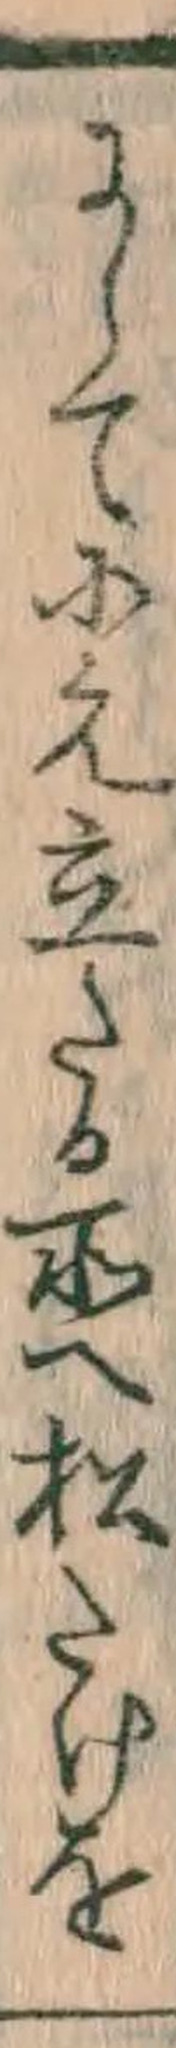にしてにえ立たる所へ松たけを
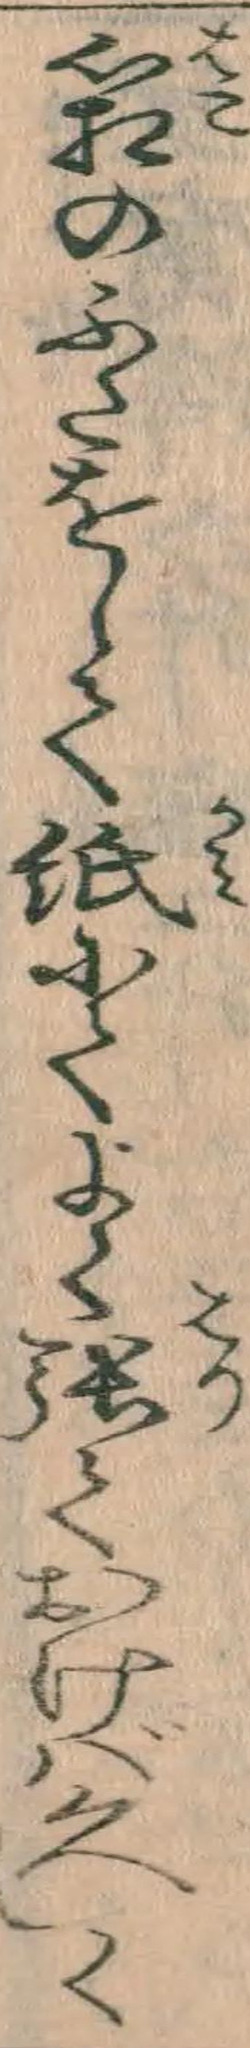箱のふたをして紙にてよく張ておけば久しく
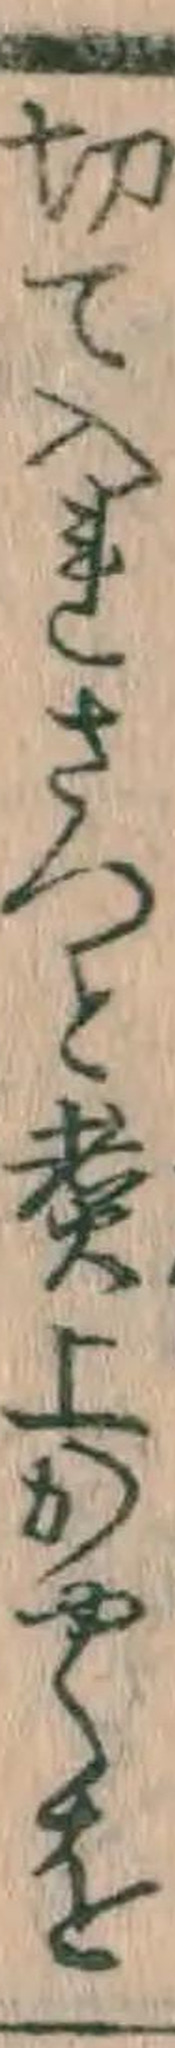切て入れさつと煮上かやくを
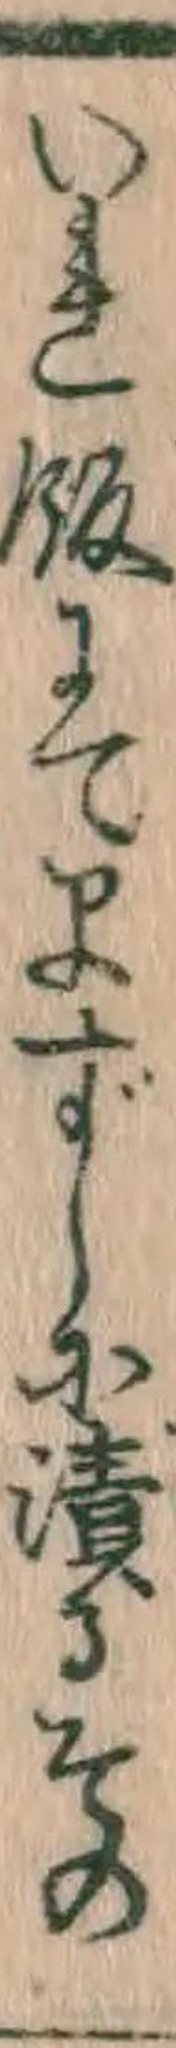いれ飯にて早ずしに漬るその
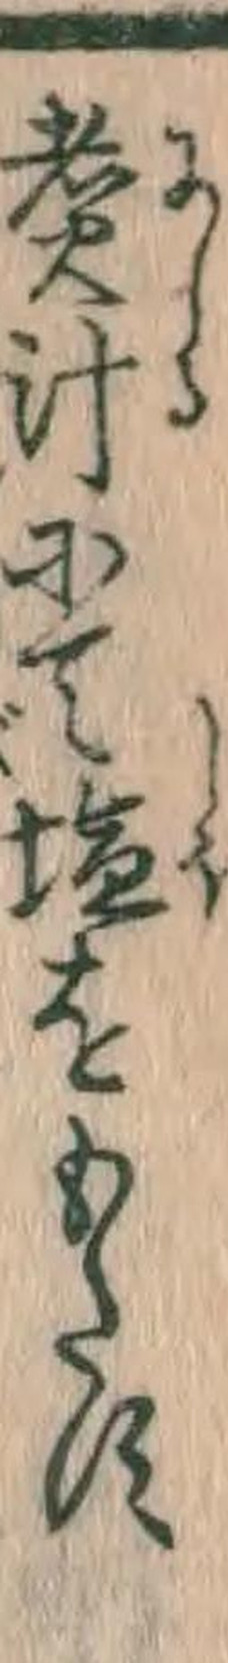煮汁にて塩をもたす
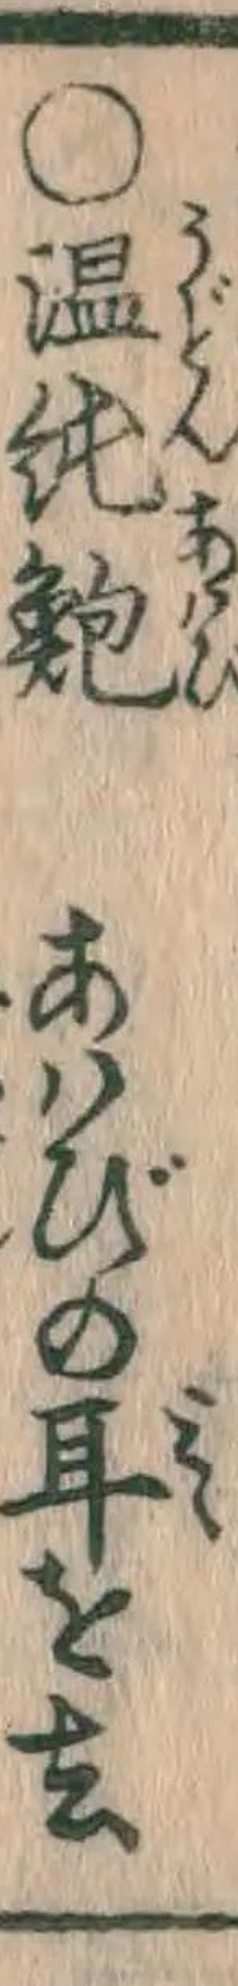○温飩鮑あはびの耳を去
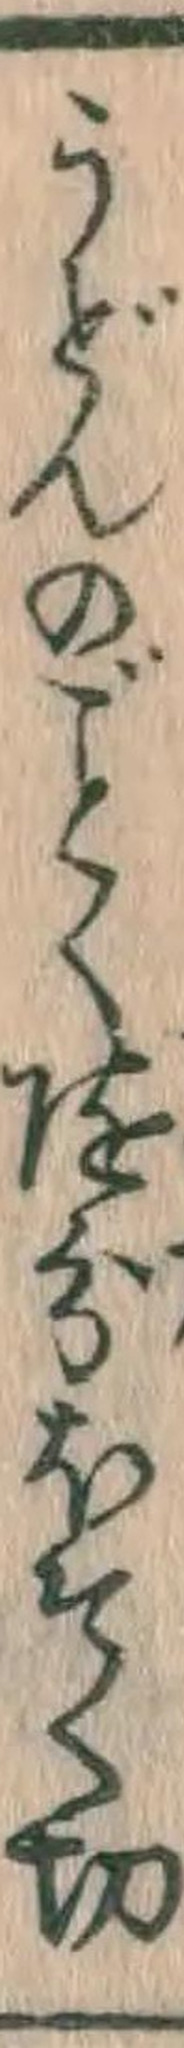うどんのごとく随分ほそく切
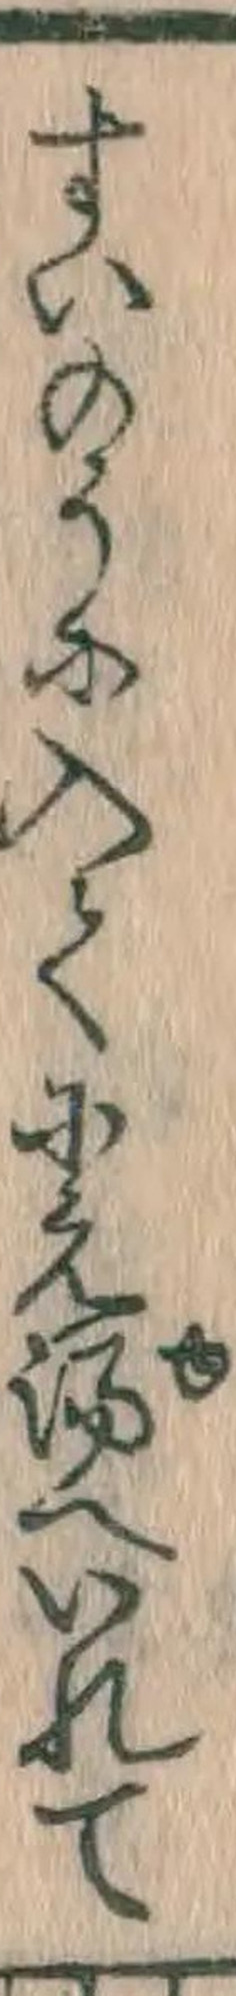すいのうに入てにえ湯へいれて
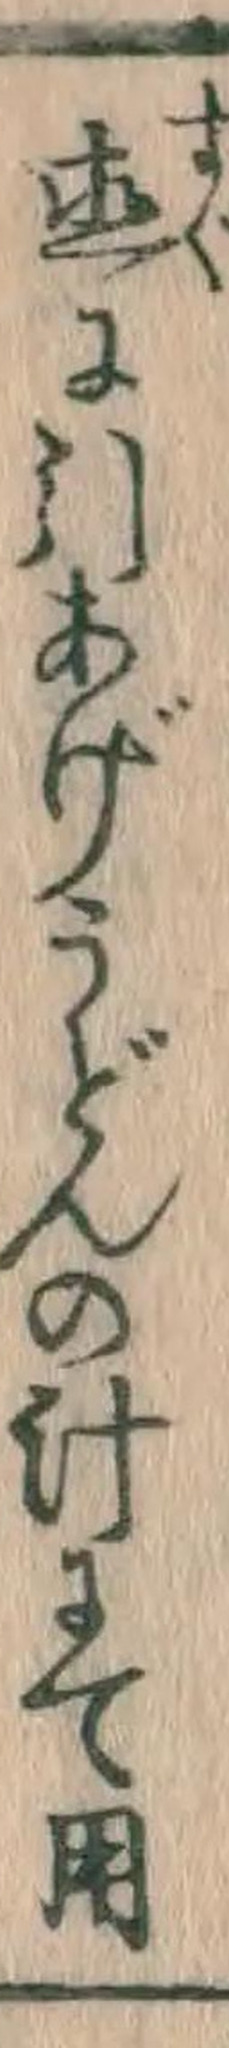直に引あげうどんの汁にて用
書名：広益秘事大全 3巻. [5]
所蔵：国立国会図書館 National Diet Library, JAPAN
